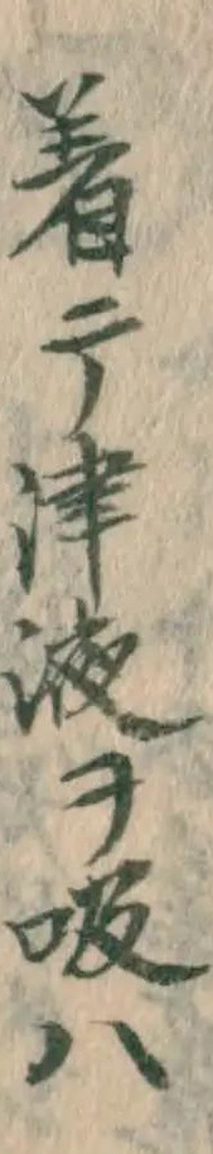着テ津液ヲ吸ハ
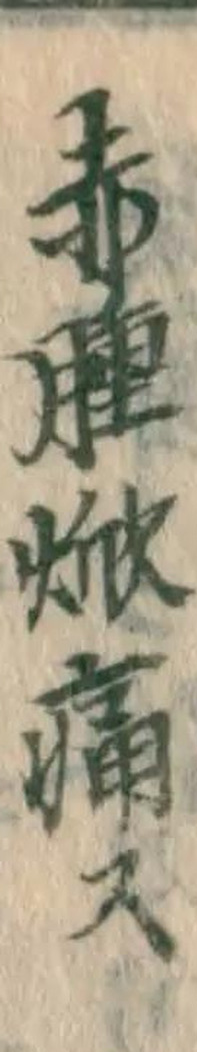赤腫焮痛ス
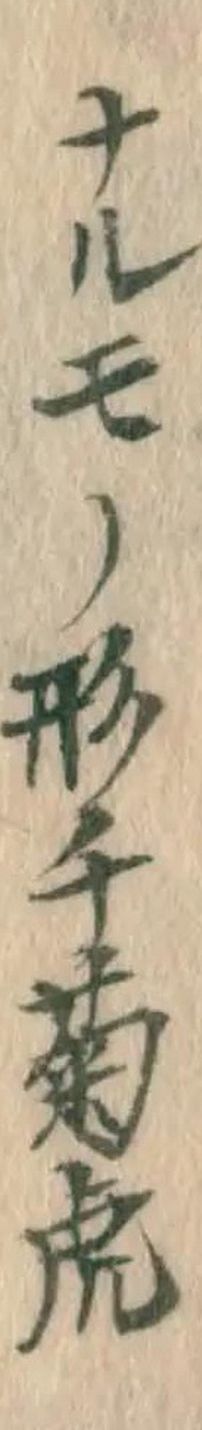ナルモノ形チ菊虎
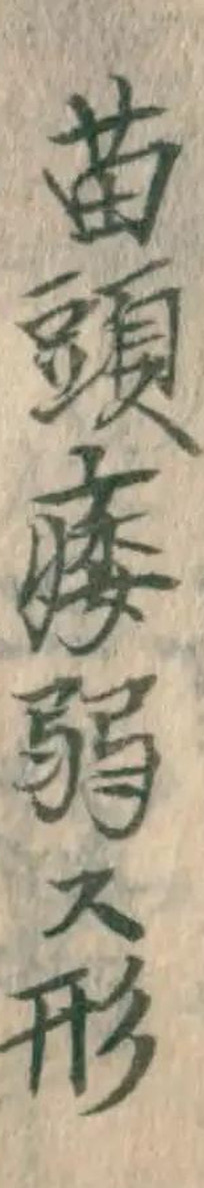苗頭痿弱ス形
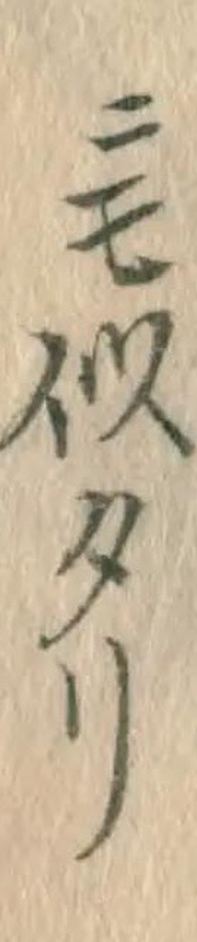ニモ似タリ
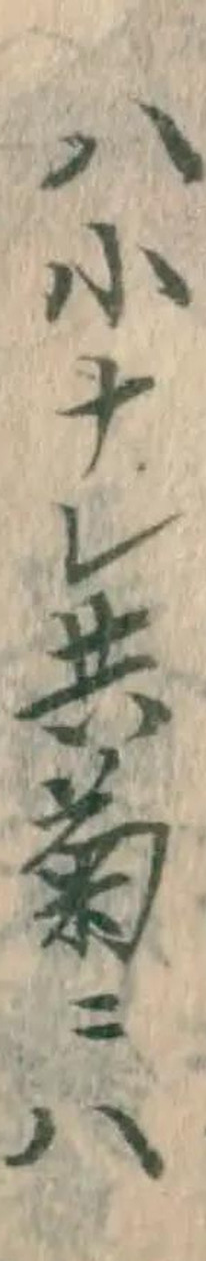ハ小ナレ共菊ニハ
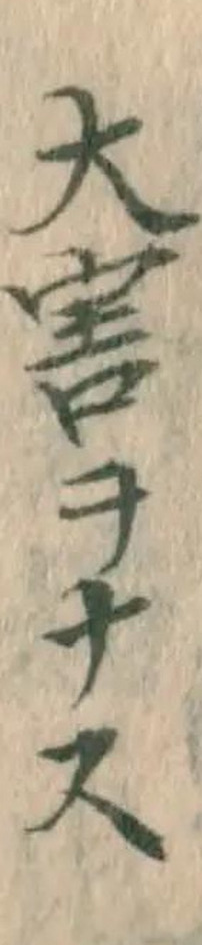大害ヲナス

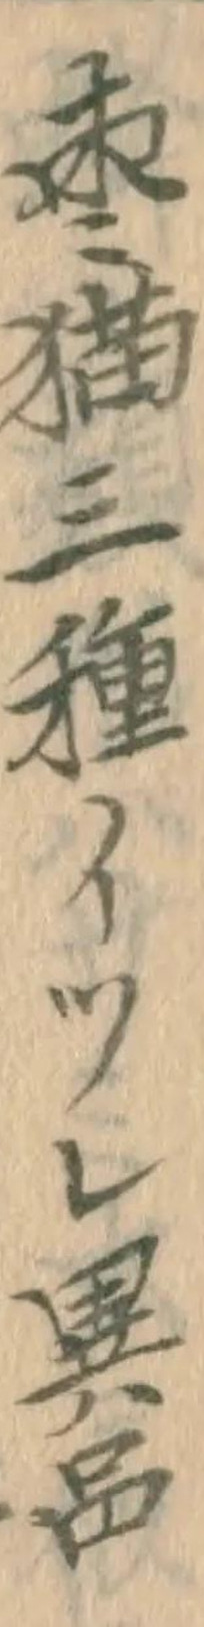棗猫三種イツレ異品
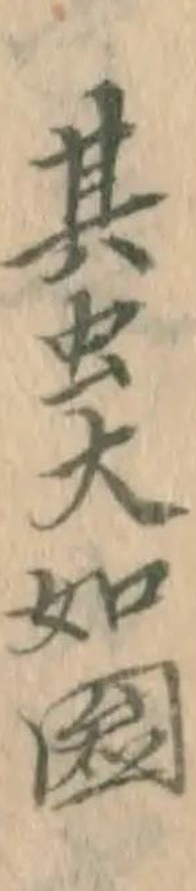其虫大如圖
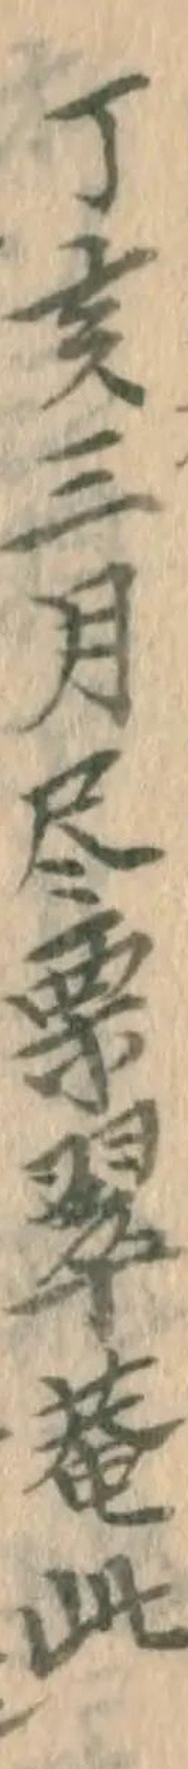丁亥三月尽栗翠菴此
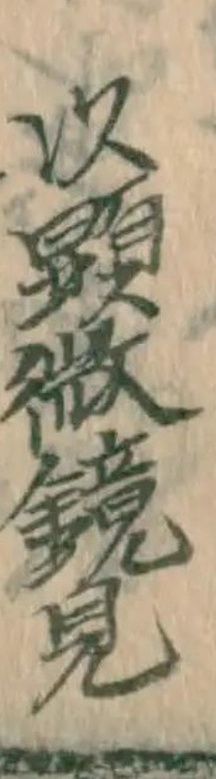以顕微鏡見
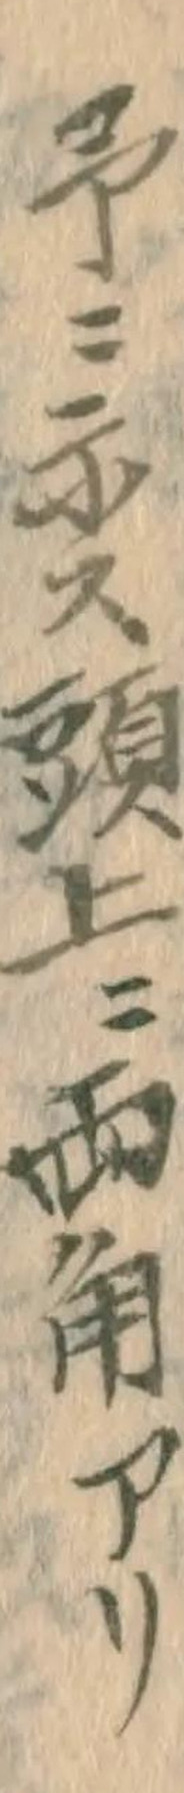予ニ示ス頭上ニ両角アリ
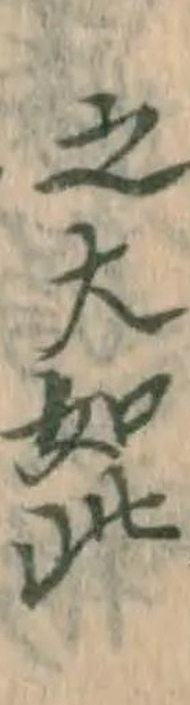之大如此
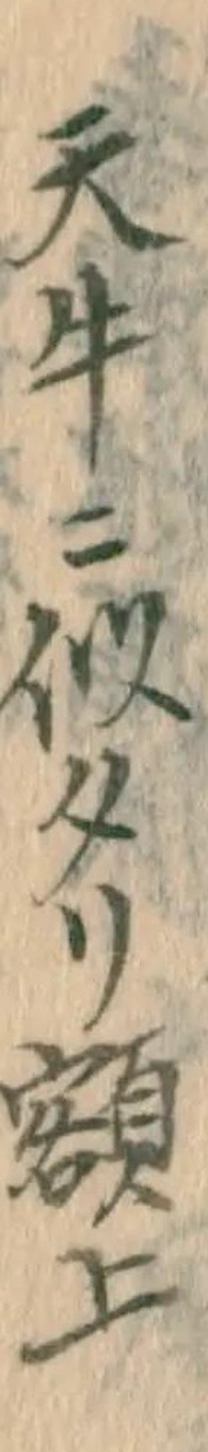天牛ニ似タリ額上
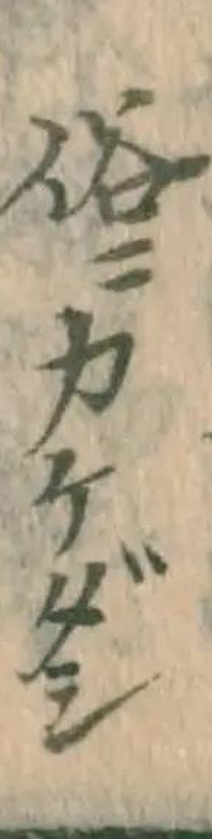俗ニカケダシ
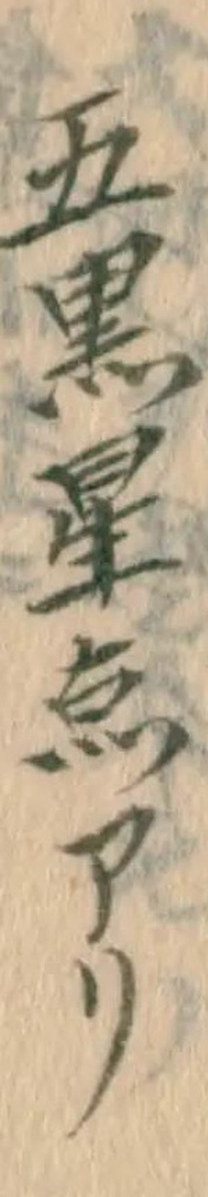五黒星点アリ
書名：千蟲譜 3巻. [2]
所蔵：国立国会図書館 National Diet Library, JAPAN
